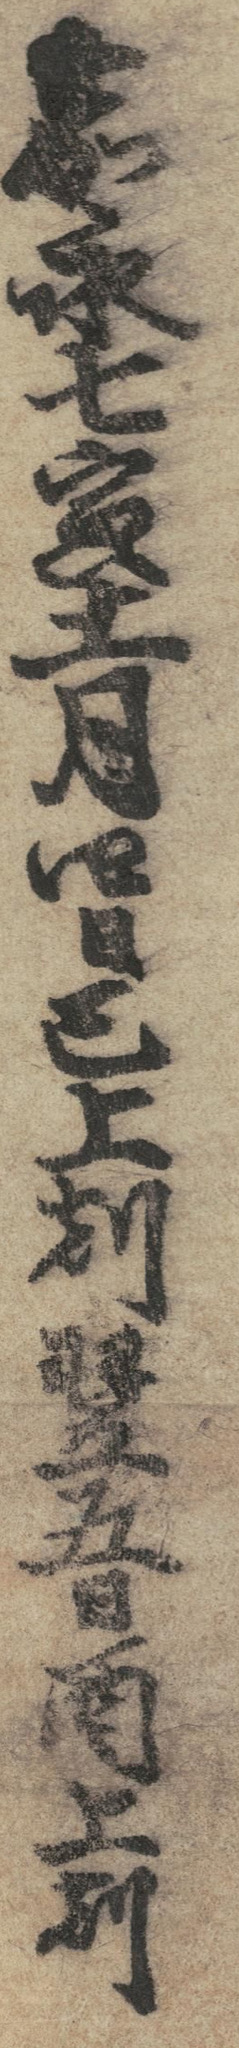嘉永七寅十一月四日巳上刻翌五日酉上刻
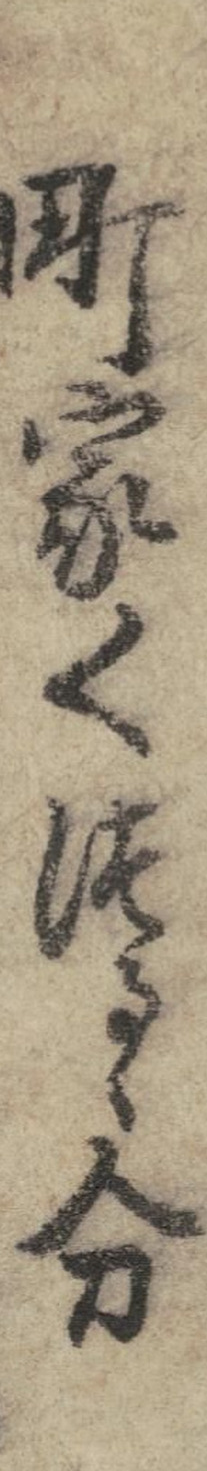町家くつるゝ分
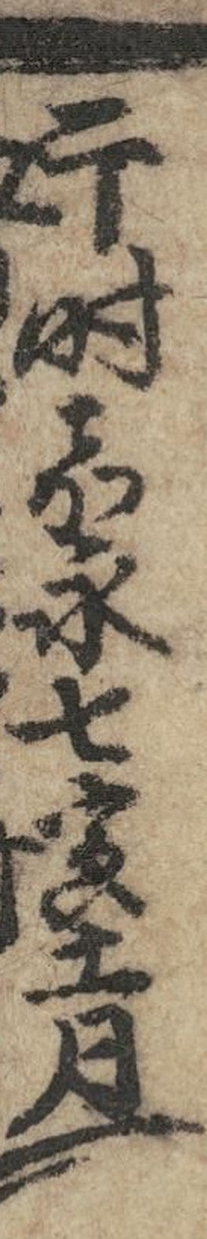亍時嘉永七寅十一月
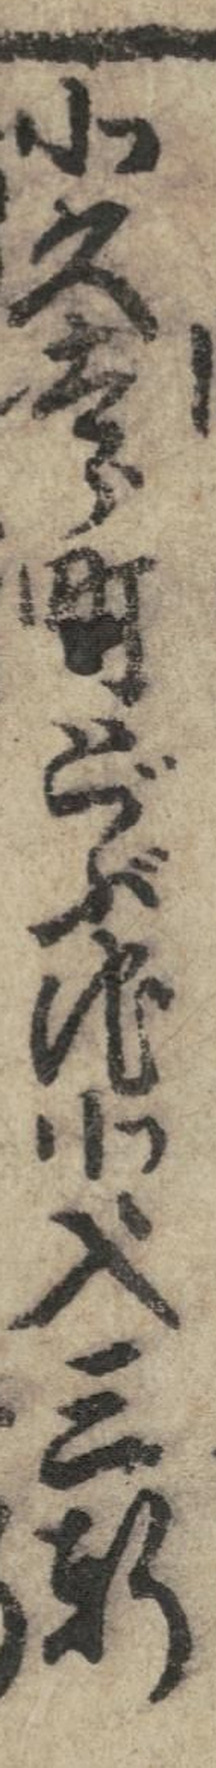北久太ら町どぶ池北入三軒
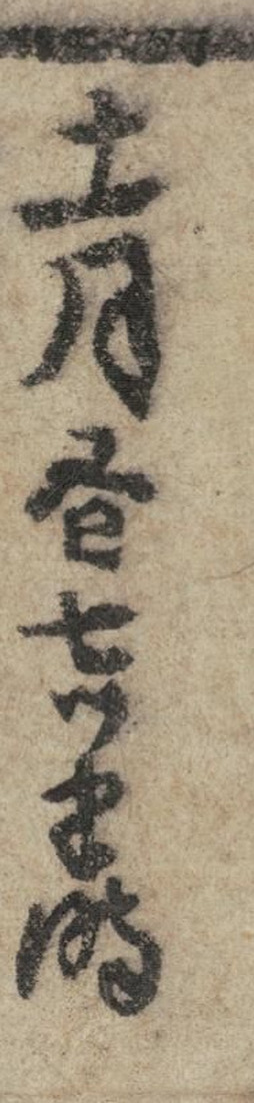十一月昼七ツ半時
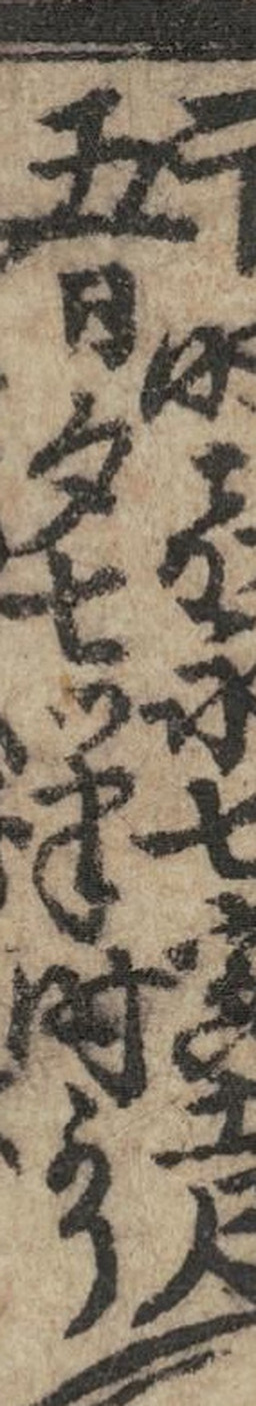五日夕七ツ半時より
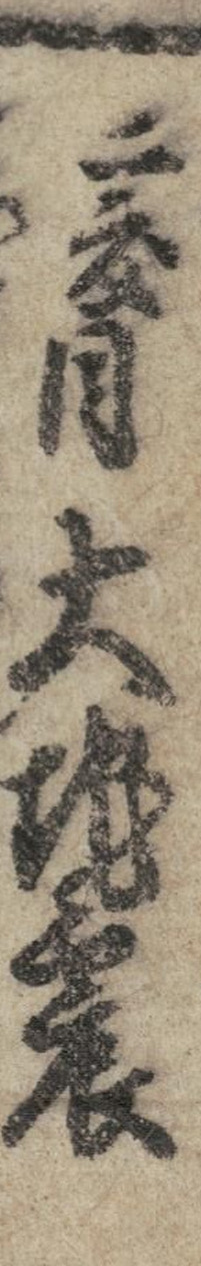二度目大地震
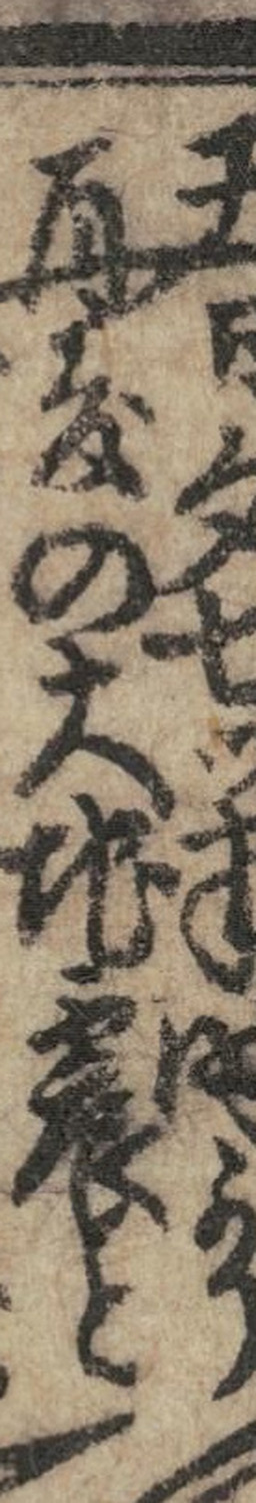再度の大地震と
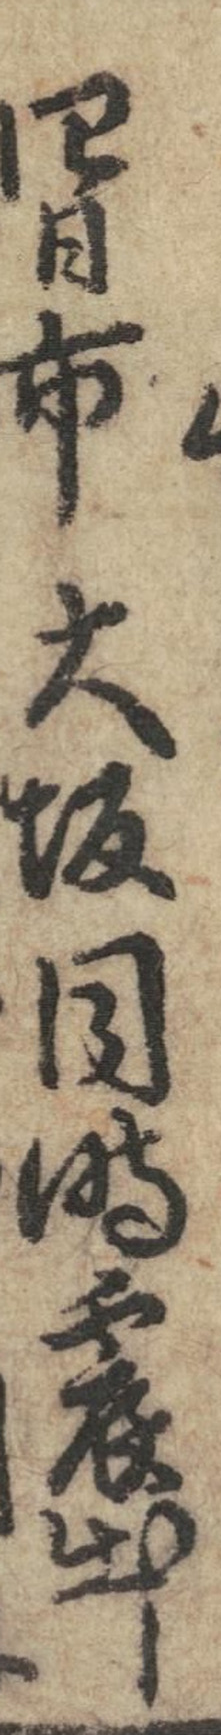四日市大坂同時震出し
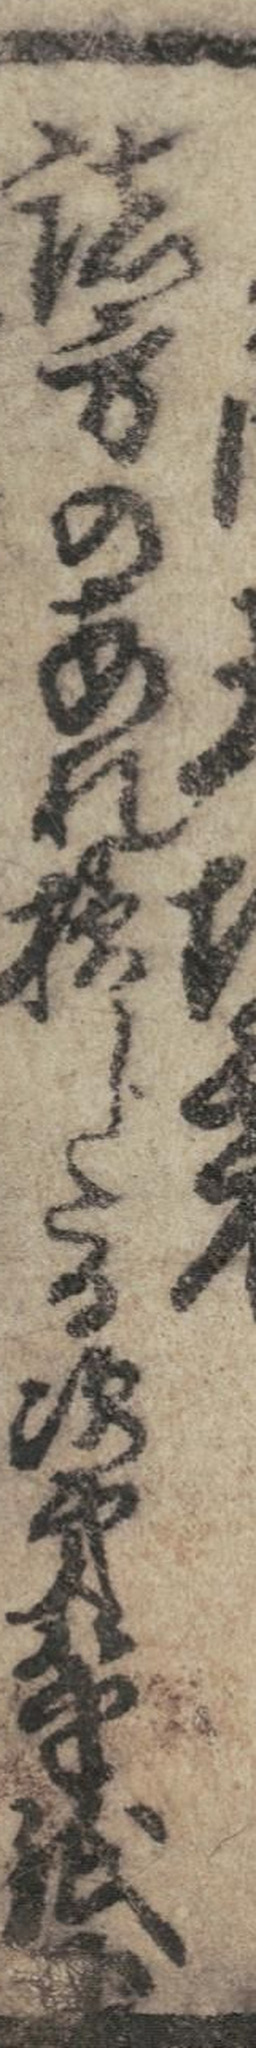諸方のあれ損じたる次第筆紙に
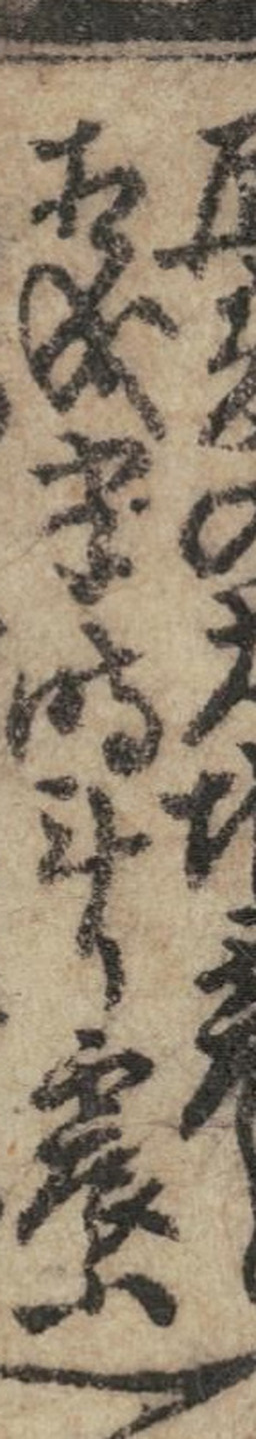相成半時計り震ふ
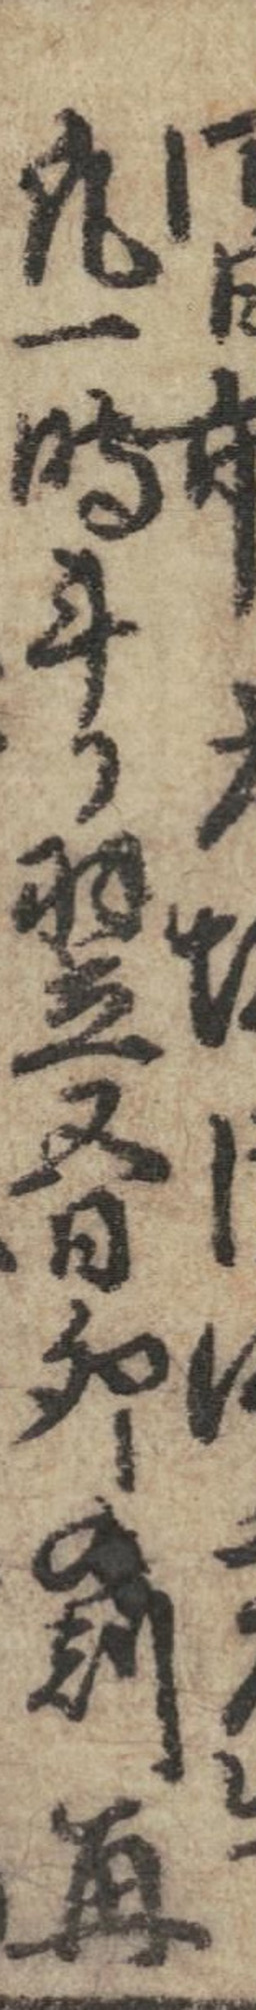凡一時計り翌五日卯の刻再
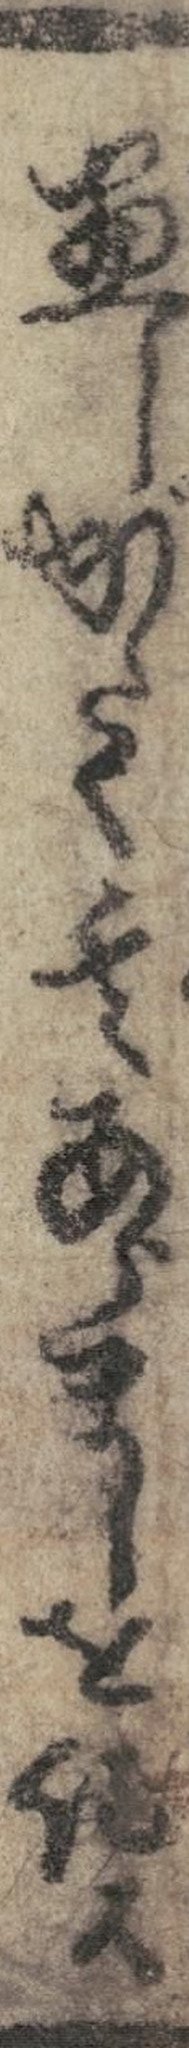尽しかたく其あらましを記ス
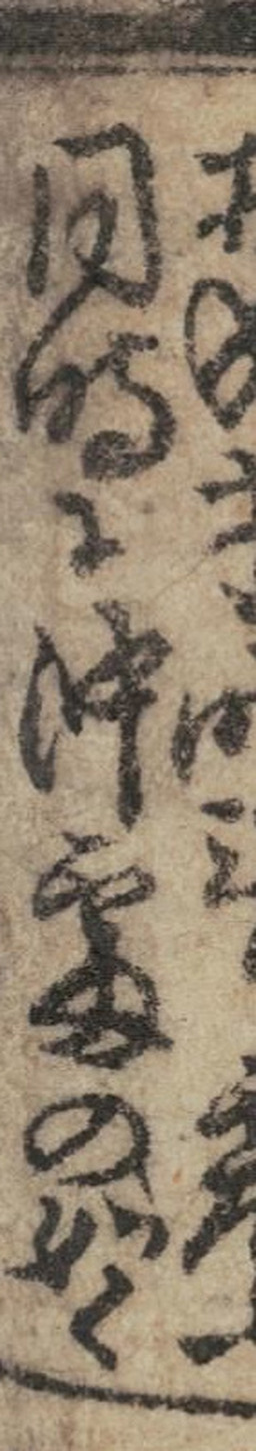同時に沖雷の如く
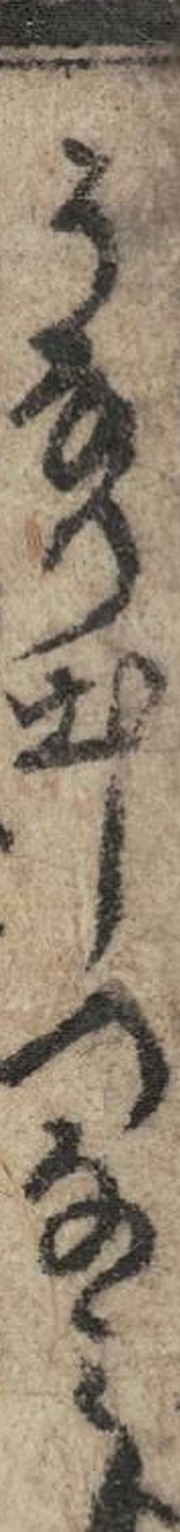うなり出しつなみ
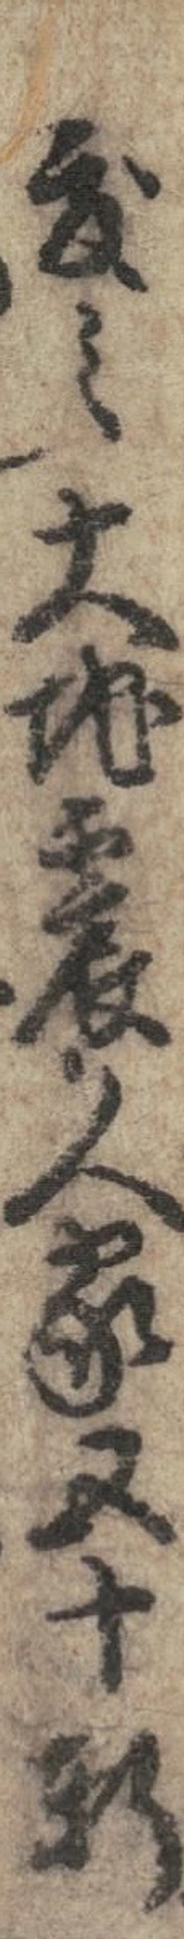度之大地震人家五十軒
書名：諸国大阪太地震大つなミ末代噺
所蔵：東京大学地震研究所図書室 Earthquake Research Institute Library, The University of Tokyo, JAPAN
